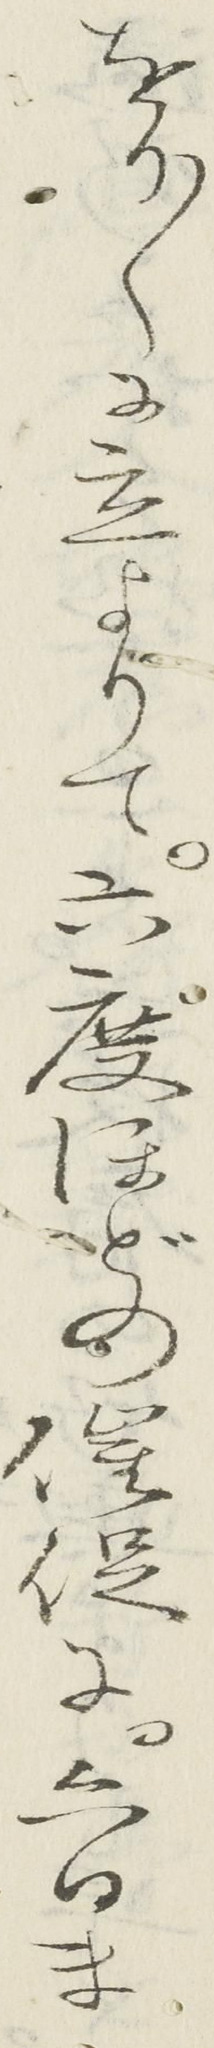をほくに立よりて。六度ほどの催促に。六日ま
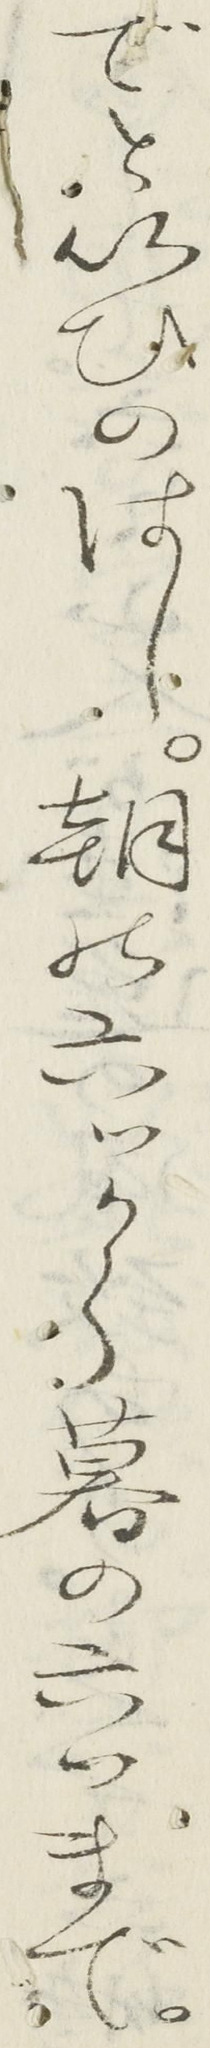でといひのばし。朝の六ツから暮の六ツまで。
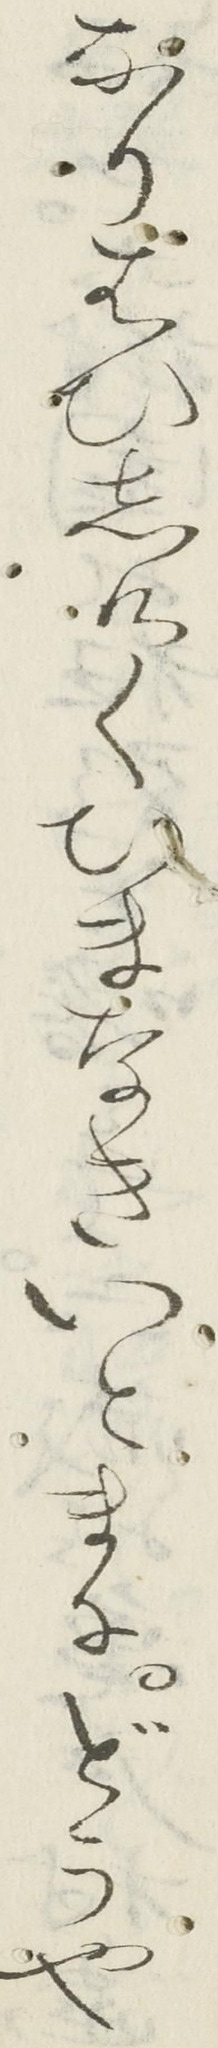なりはひしけくひまなきいとまに。どうや
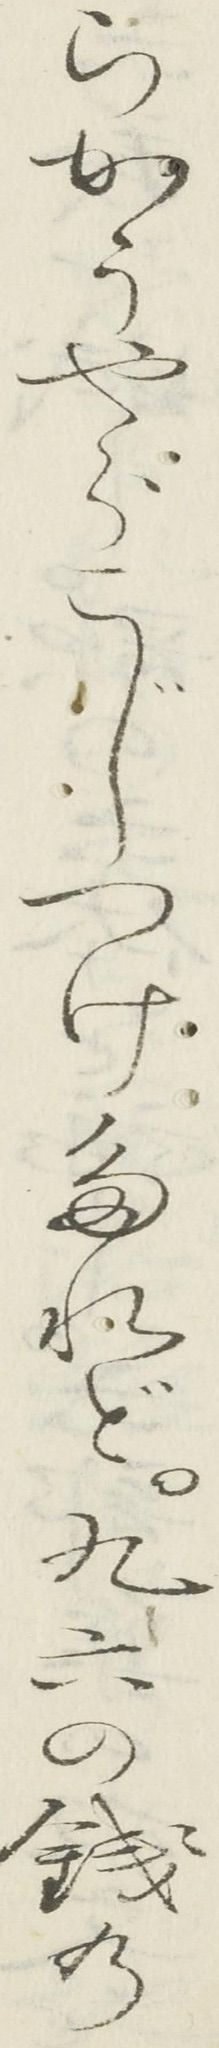らかうやらこじつけたれど。九六の銭の
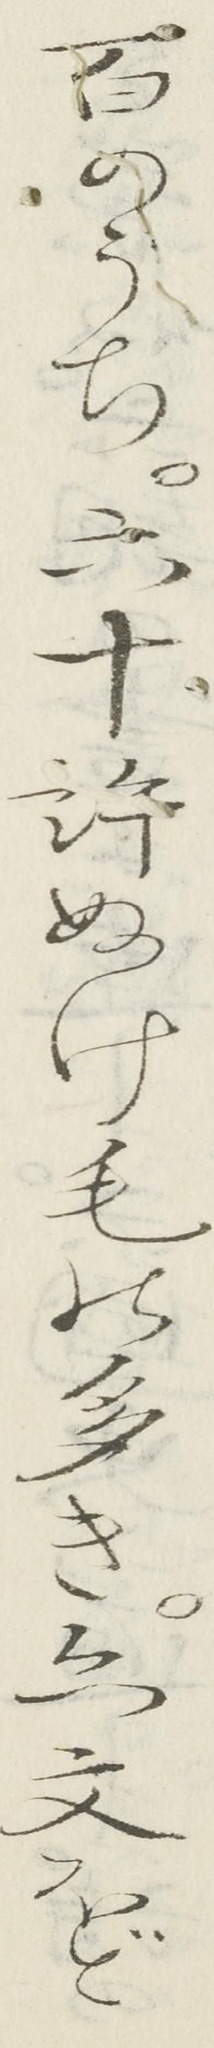百のうち。六十許ぬけもの多き。六文ほど
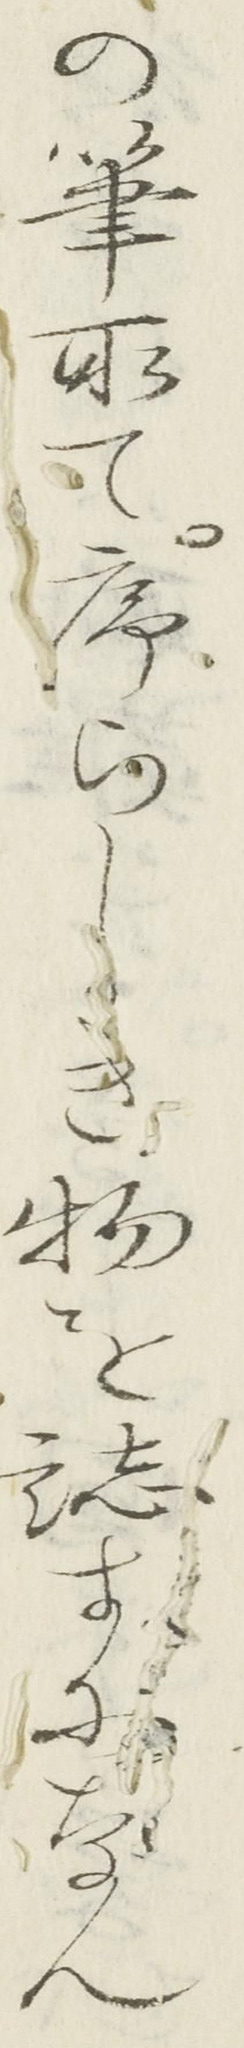の筆取て。序らしき物を誌すになん
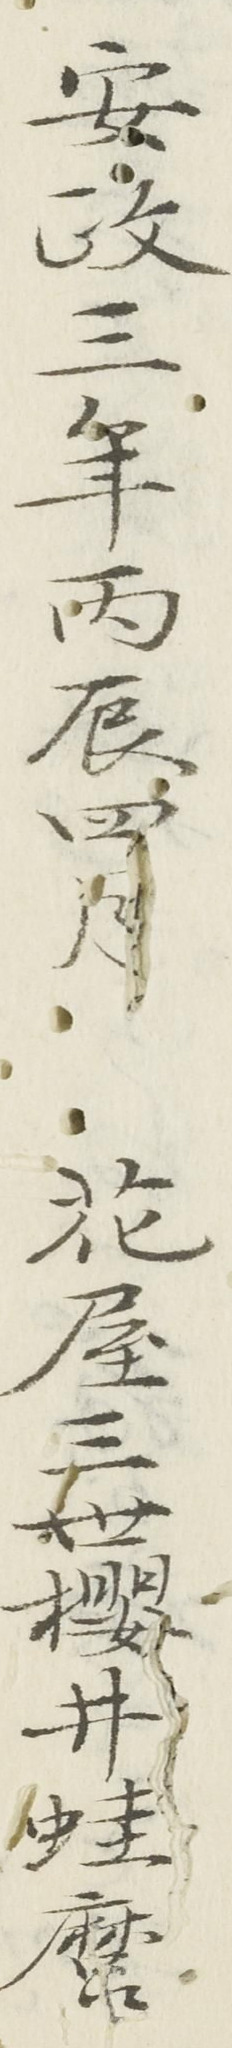安政三年丙辰四月花屋三世桜井蛙麿
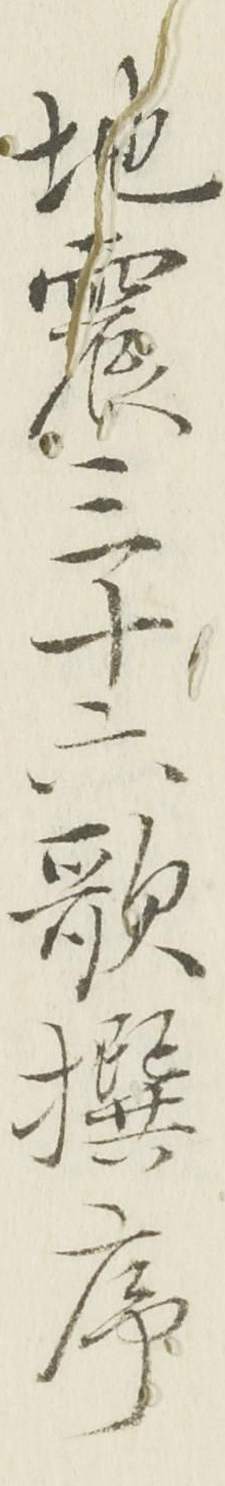地震三十六歌撰序
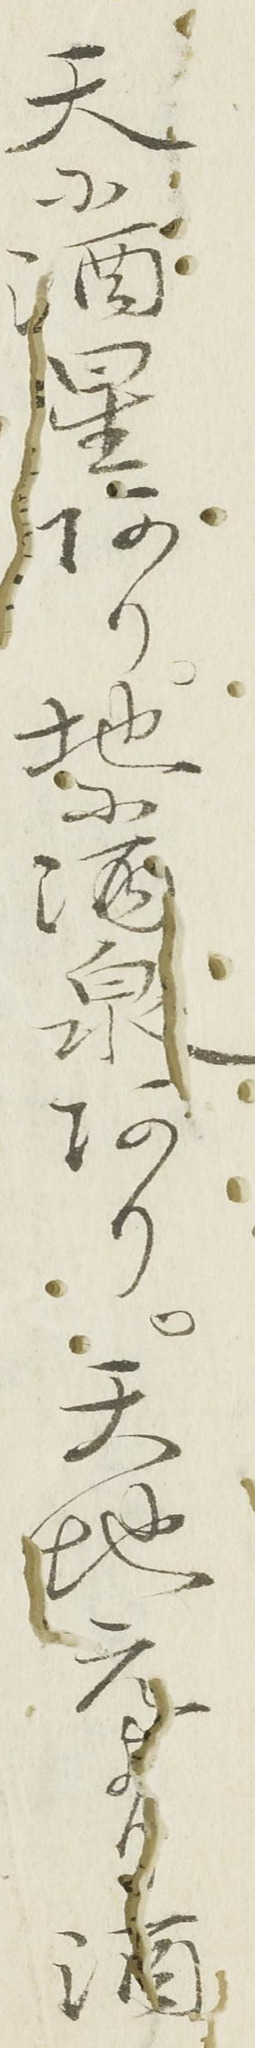天に酒星あり。地に酒泉あり。天地元より酒
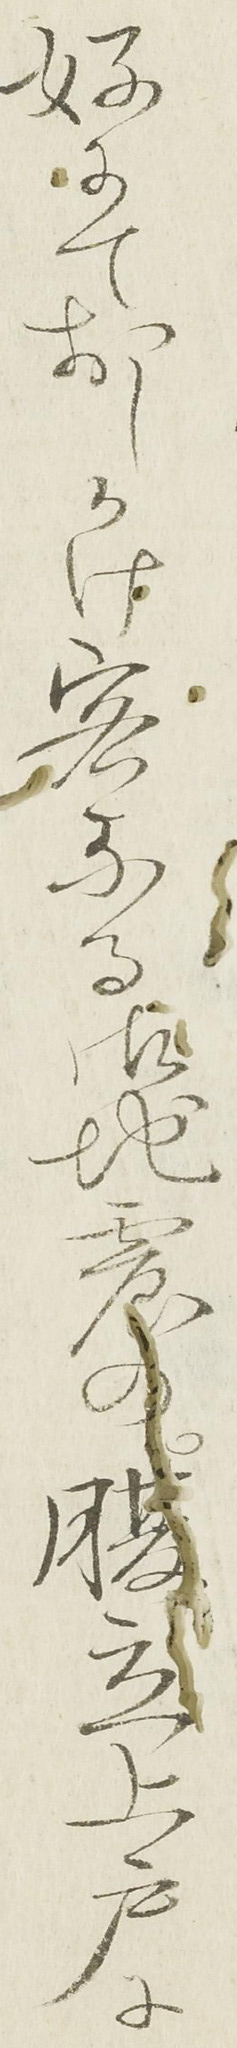好にておしかけ客なる御地震の。腹立上戸に
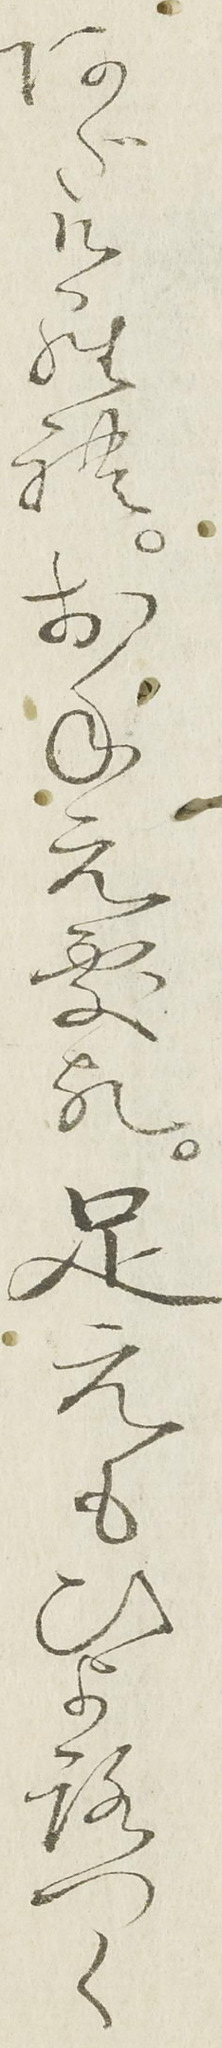あざけられ。お手元処歟。足もひよろつく
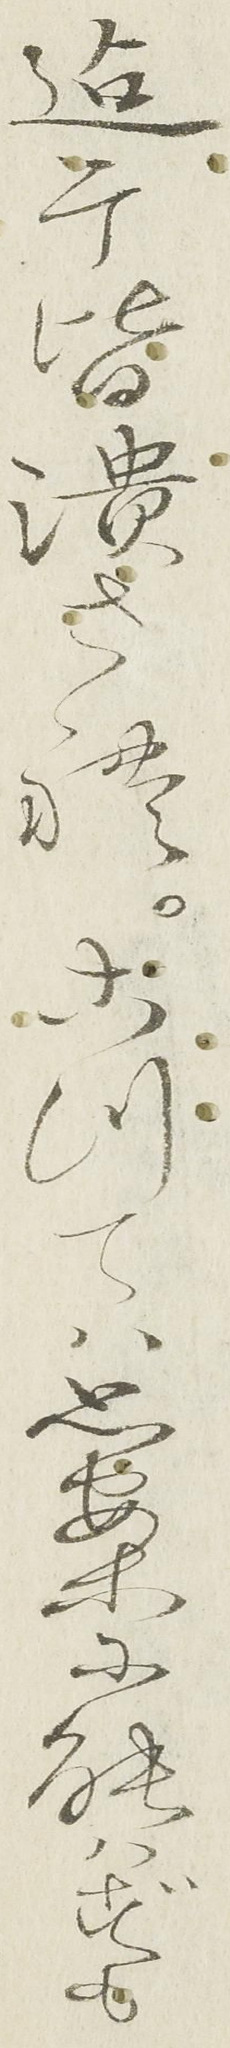迄に皆潰され。こつては思案に能はずも
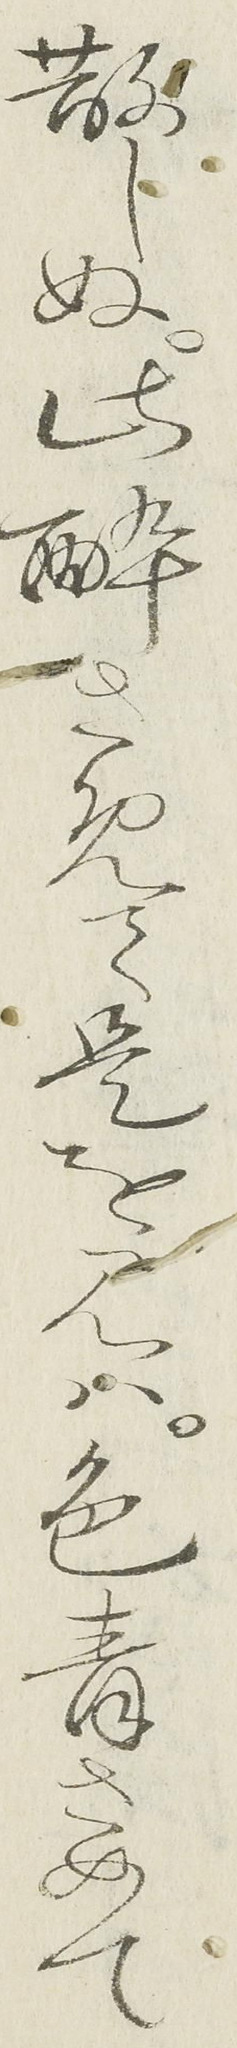散しぬ。此酔さめて是を見は。色青さめて
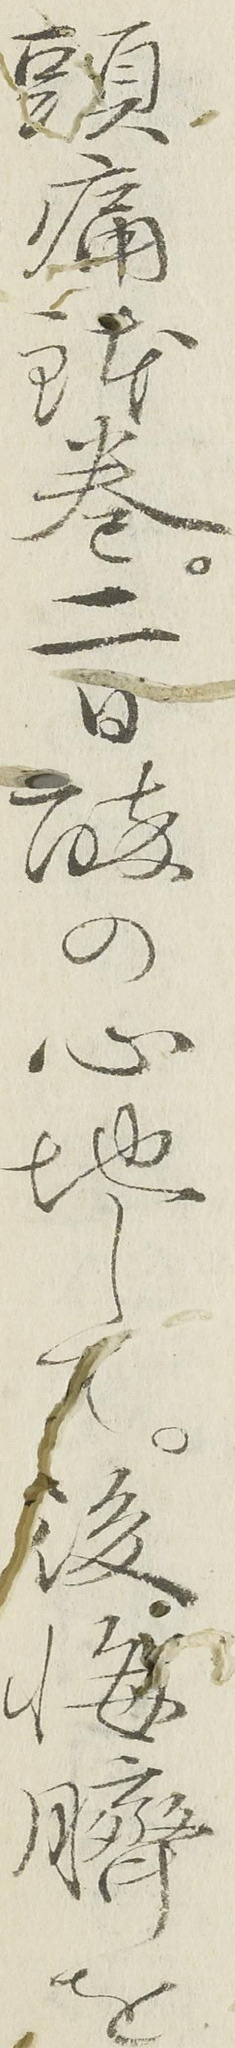頭痛鉢巻。二日酔の心地して。後悔臍を

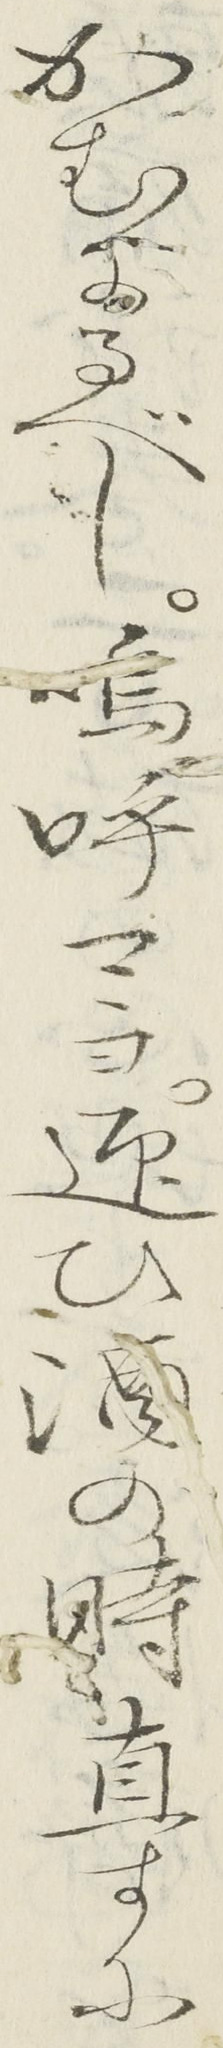かむよるべし嗚呼マヽヨ迎ヒ酒の時直すに
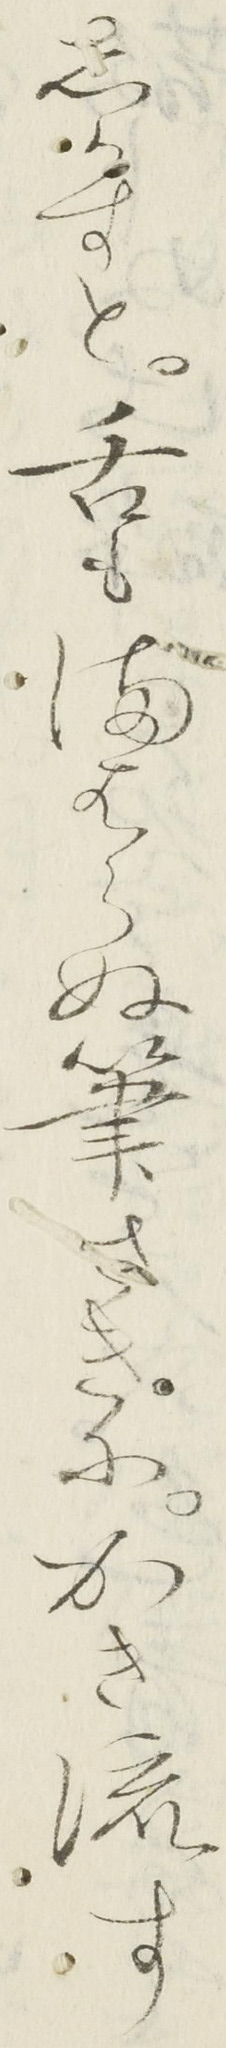思申わすと舌もまむらぬ筆さきにかき流す
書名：地震考證　全
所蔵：東京大学地震研究所図書室 Earthquake Research Institute Library, The University of Tokyo, JAPAN
